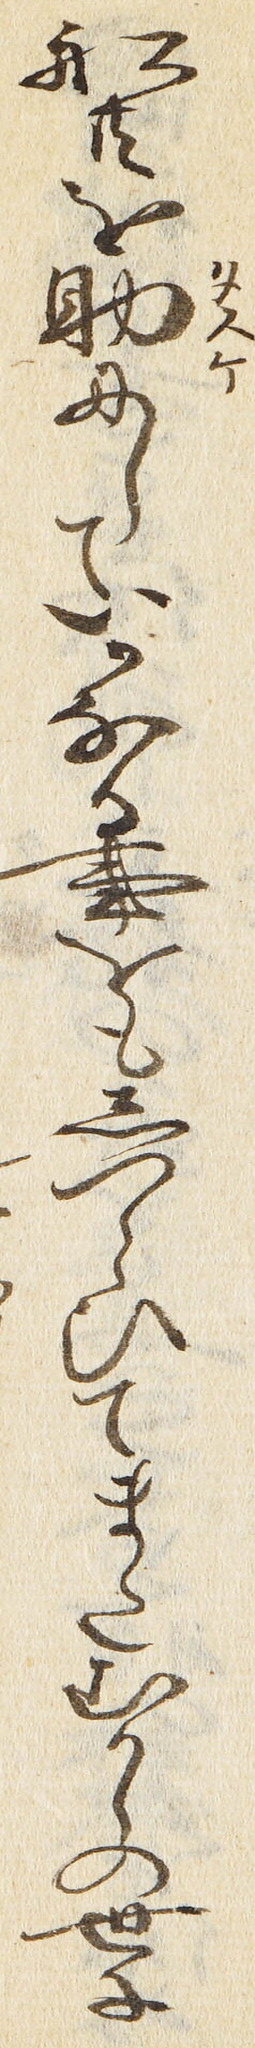船共を助にしていかなる事をもしつらひてまたむかしの世に
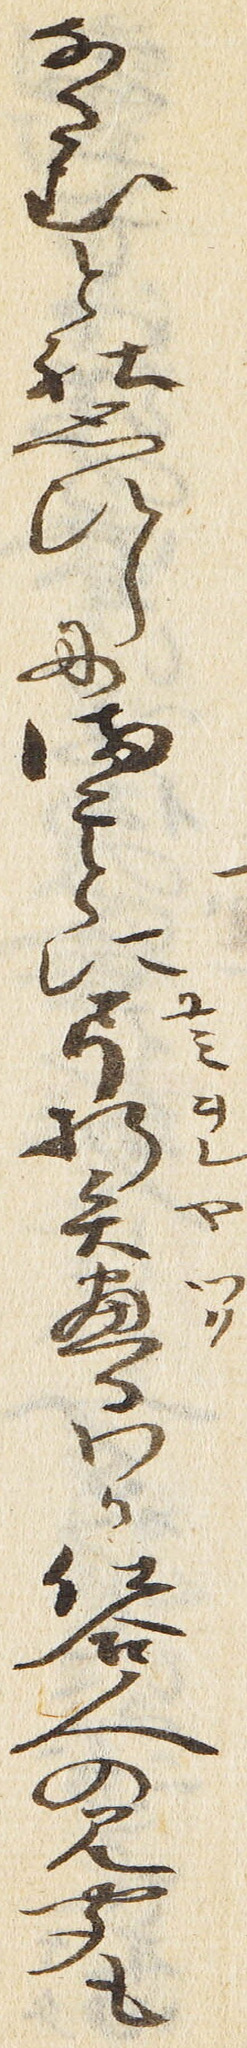なさむと社思ひしにまことに弓折矢尽るわか仕合人の見聞も
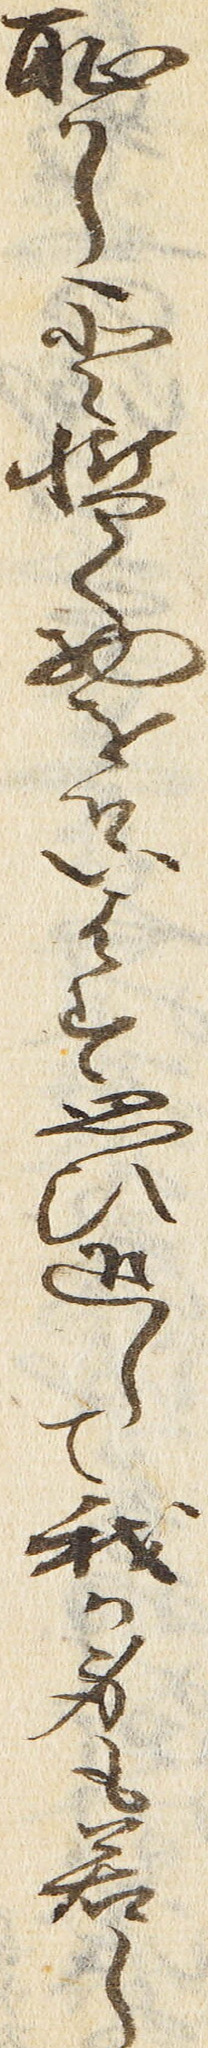恥かしくと暫く物をそいはす思ひ返して我か身も若し
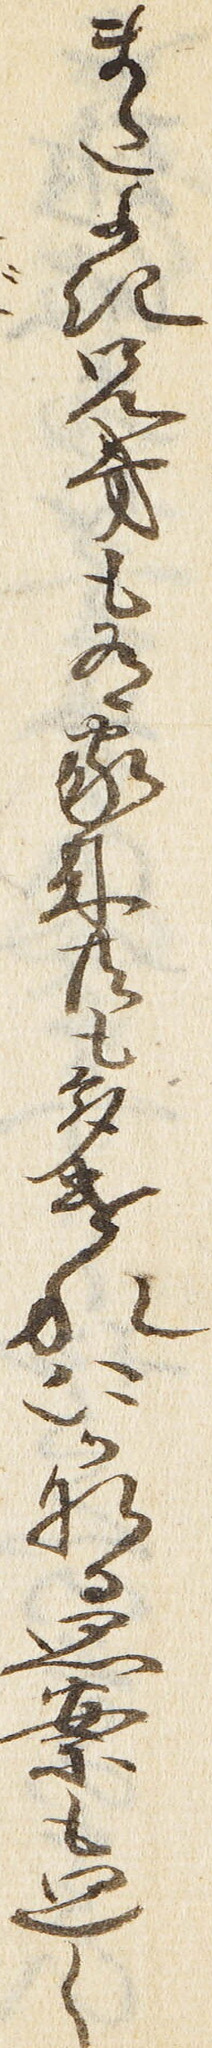またよき兄弟も有家来共も多けれはいかなる思案も廻し
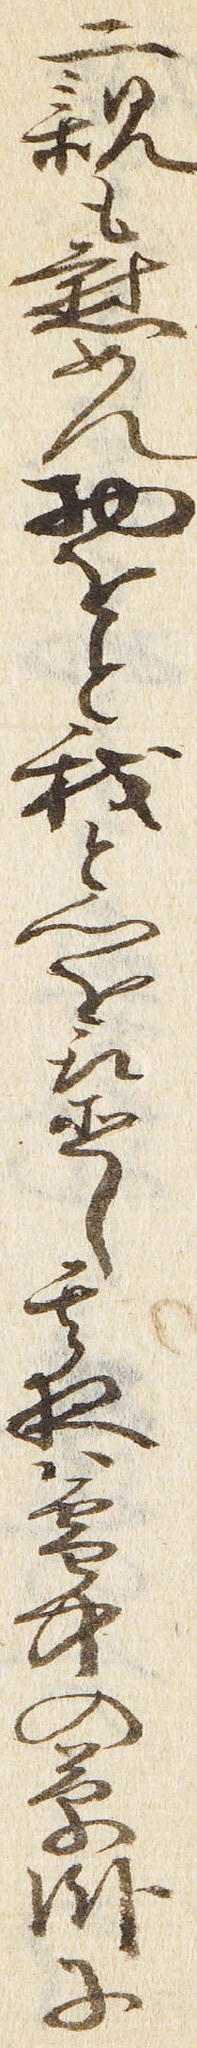二親も慰めん物をと我と心を取直し其夜は雪中の草臥に
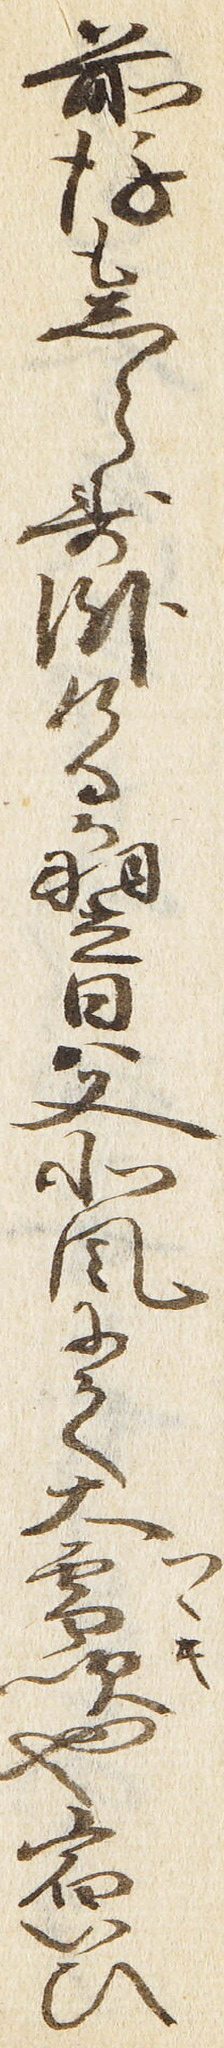前後もししらす臥けるか翌日は又北風にて大雪吹也宿いひ
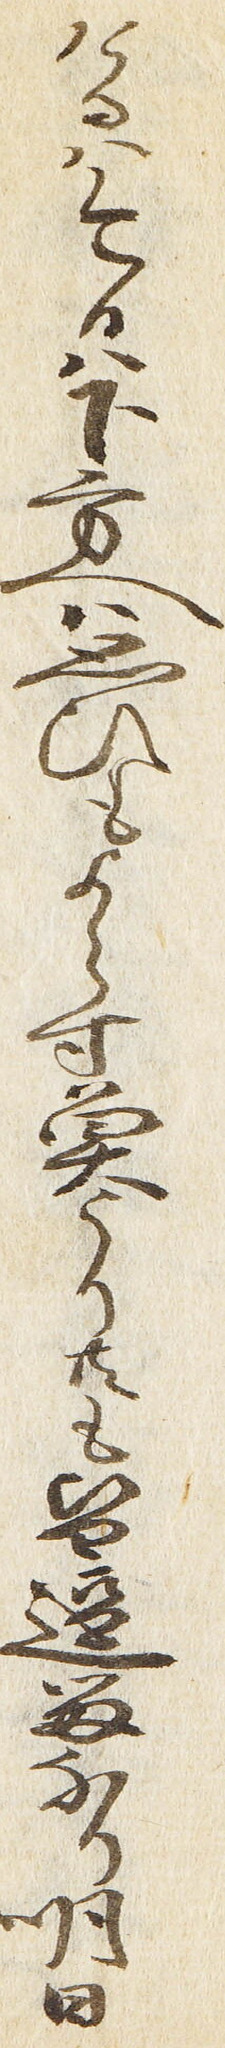けるは今日は下方へは思ひもよらす魚うり共も皆逗留なり明日
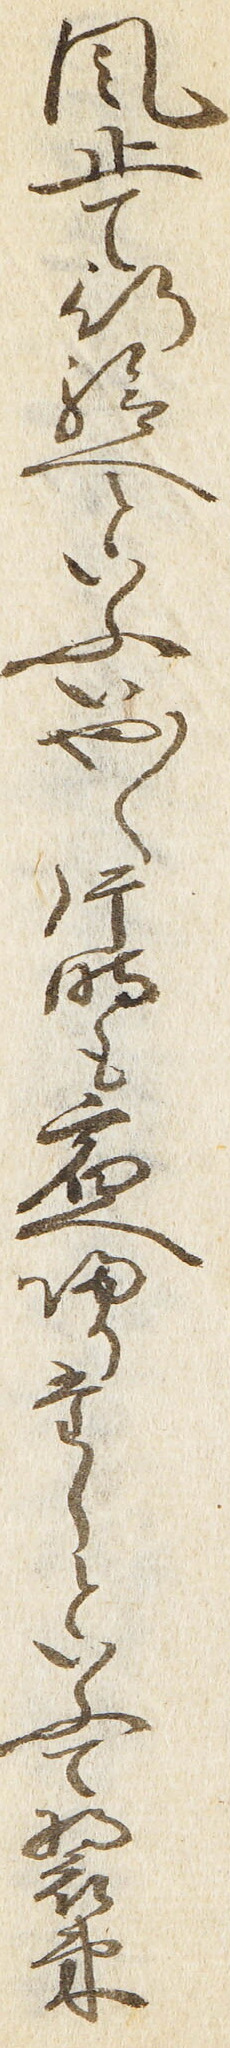風止て行給へといふいや〳〵片時も宿へ帰りたしといふて装束
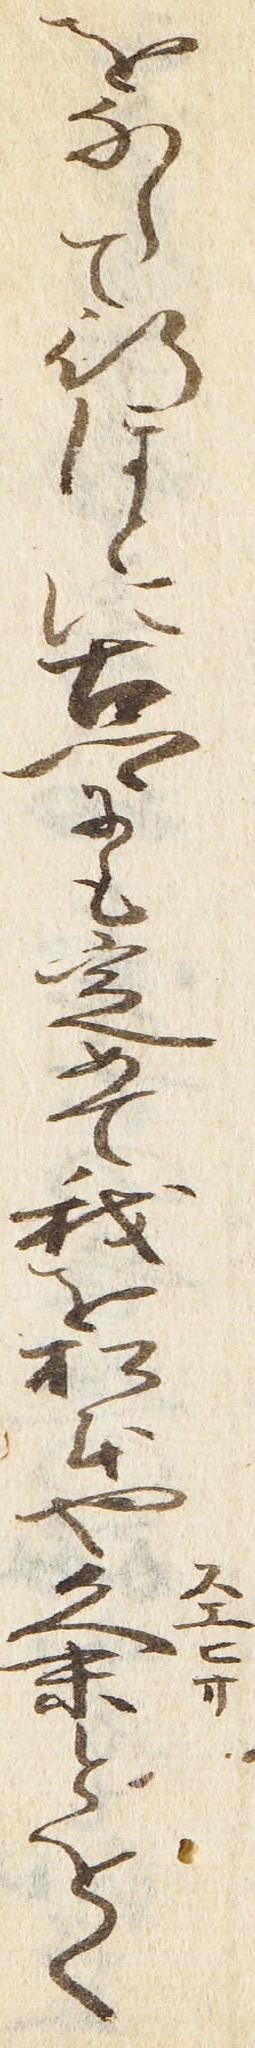をなして行ほとに古郷にも定めて我を松本や久末とをく
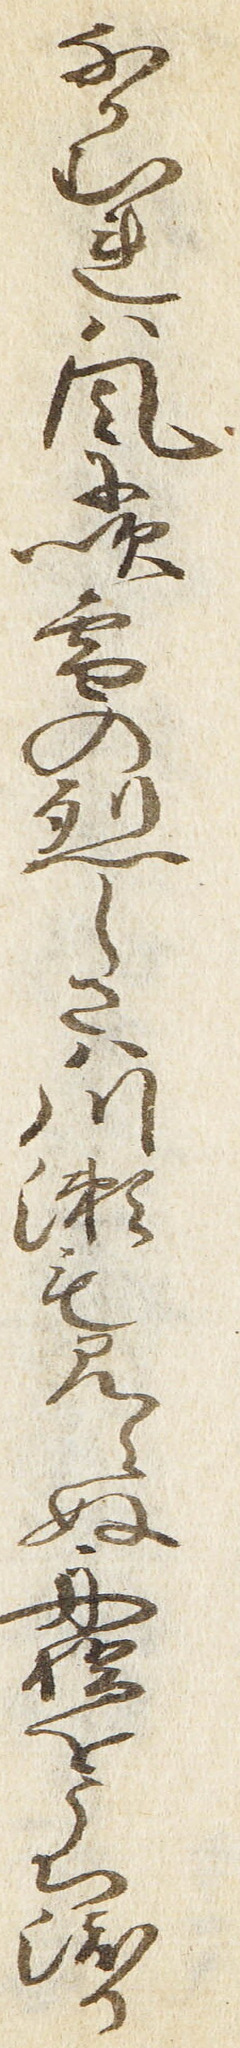なかむれは風に吹雪の烈しさは川瀬も見えぬ舟橋をうち渡り
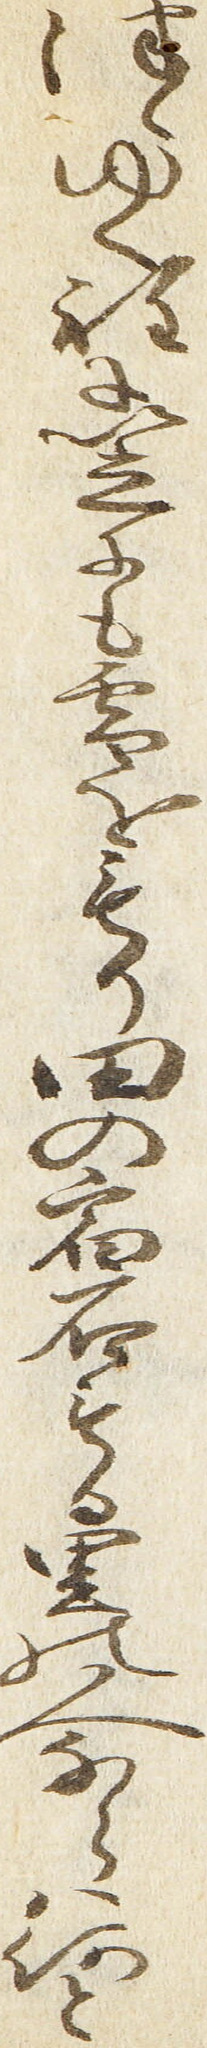つゝゆく程に笠にも雪をもり田の宿石もる里の人ならは何と
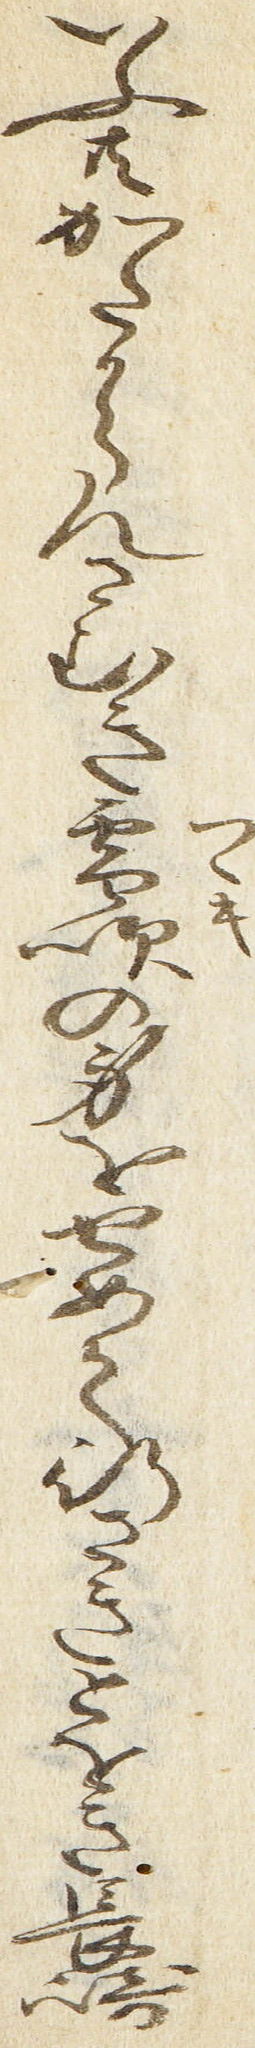いふ共かたからんさむき雪吹の身をせめて行さきとをき長崎

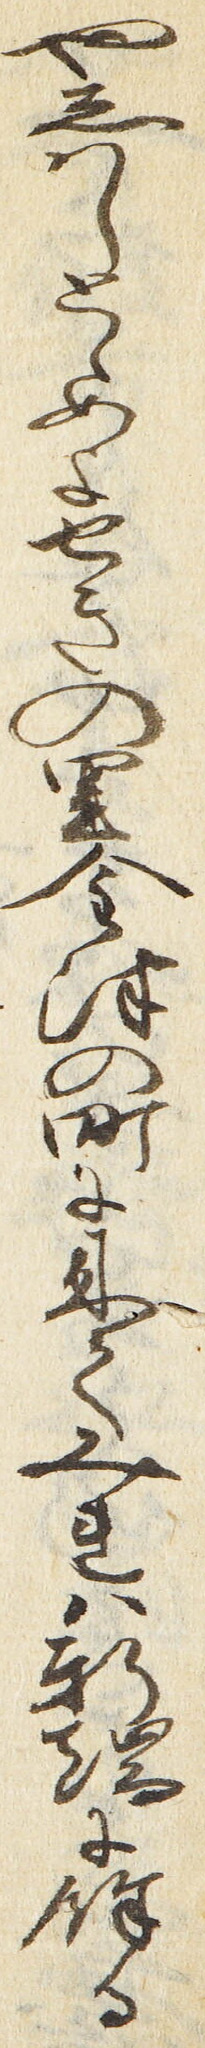やしはしとゝめよせきの里金津の町に来てみれは軒端に余る
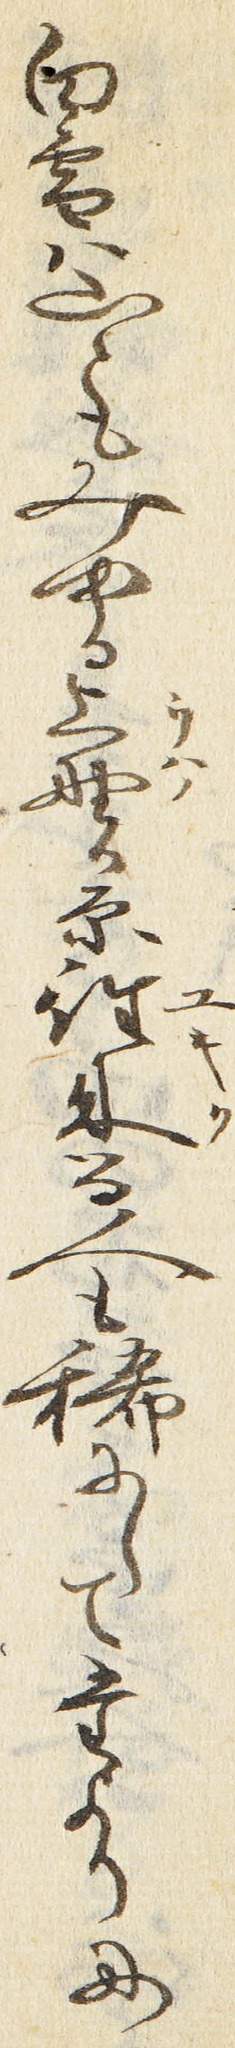白雪は山ともみゆる上野か原往来る人も稀にしてたよりに
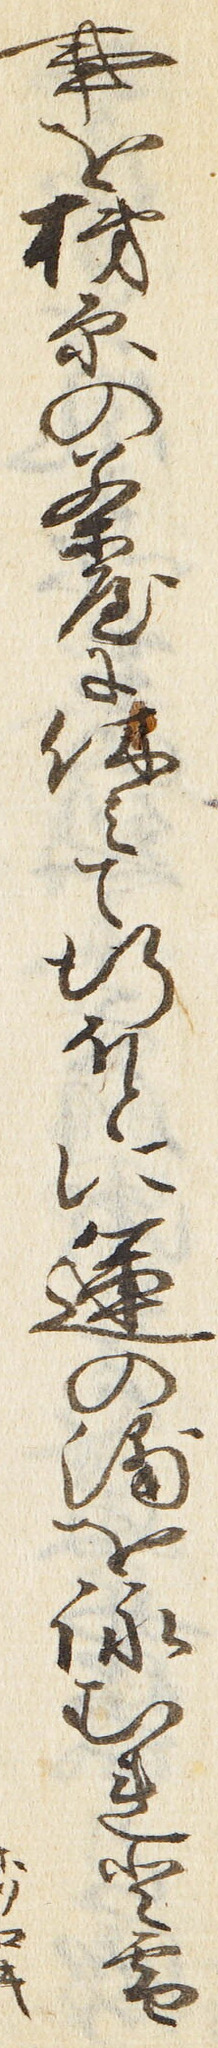事を柿原の茶屋に休みて行ほとに運の浦を詠むれと雪
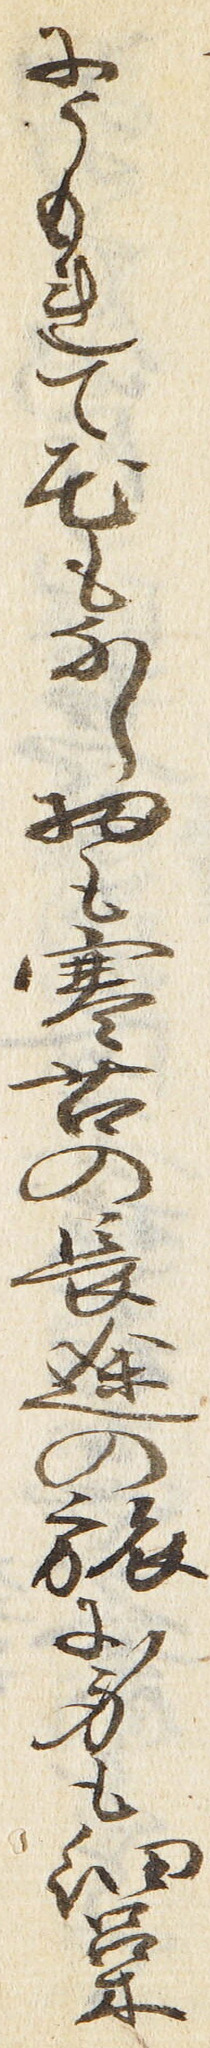にうもれて花もなし扨も寒苦の長途の旅に身も細呂木
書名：海陸世話日記
